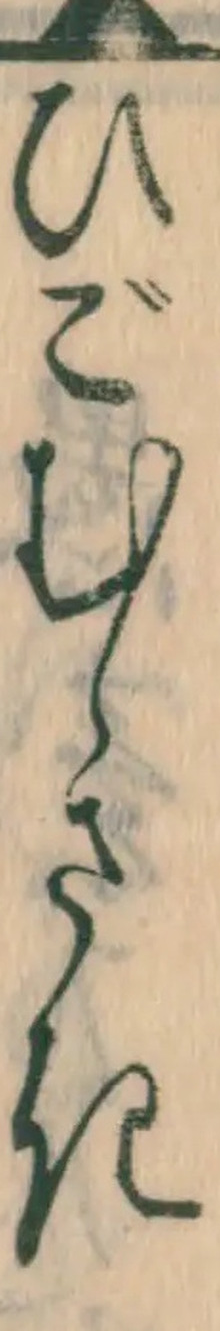▲ひごむらさき
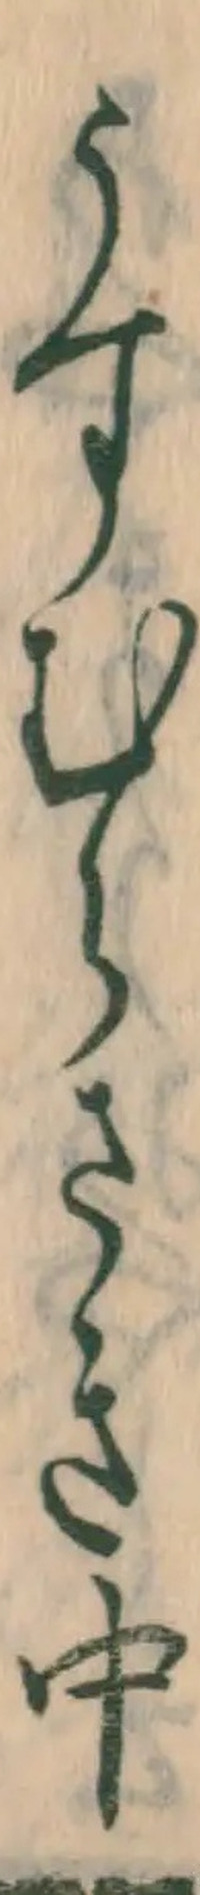うすむらさき中
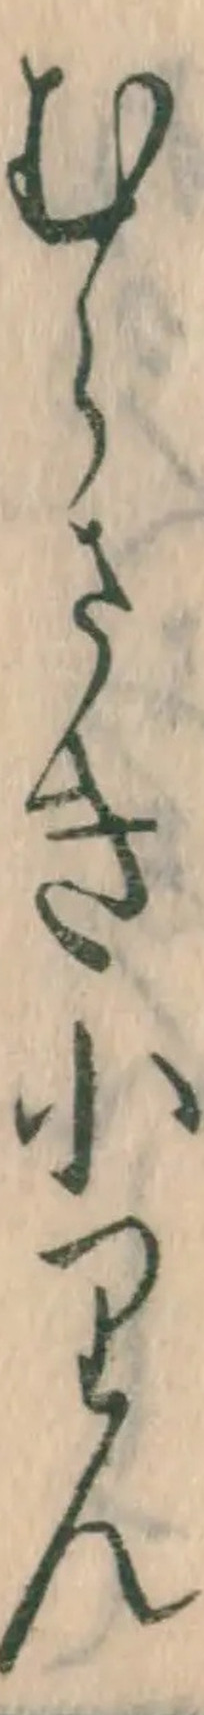むらさき小りん
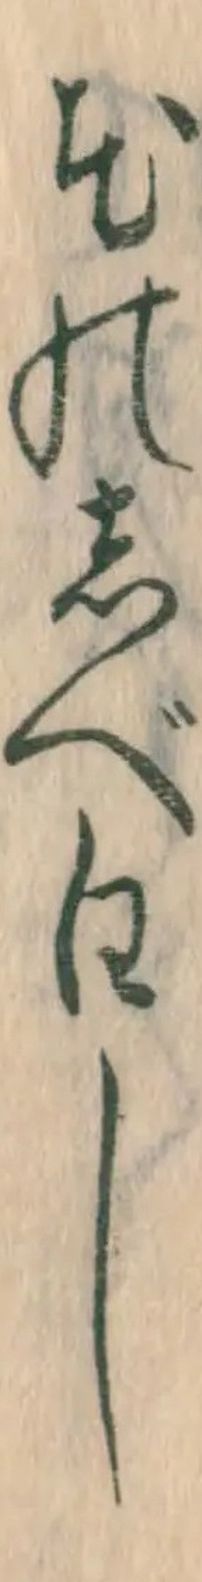花のしべ白し
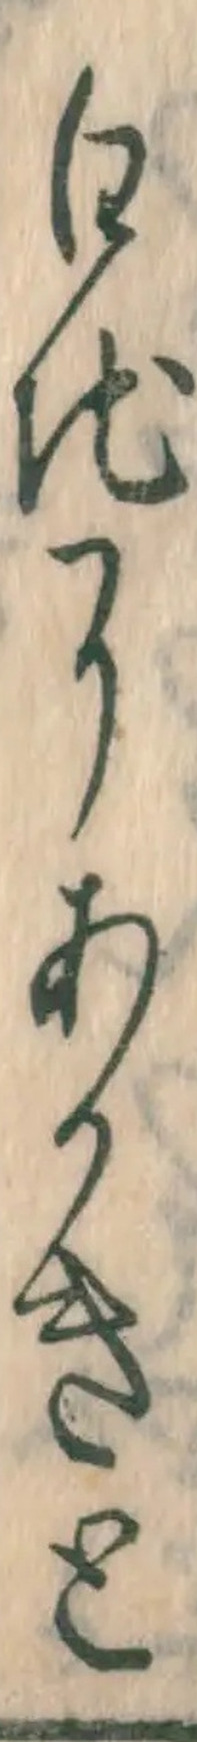白地にあかきと
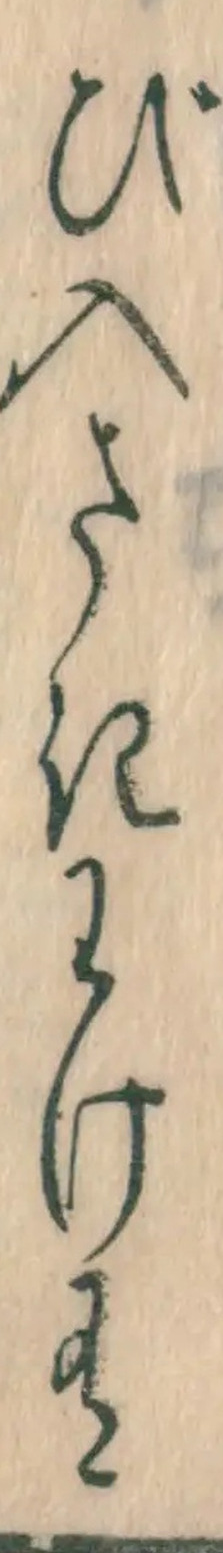び入さきわけ有
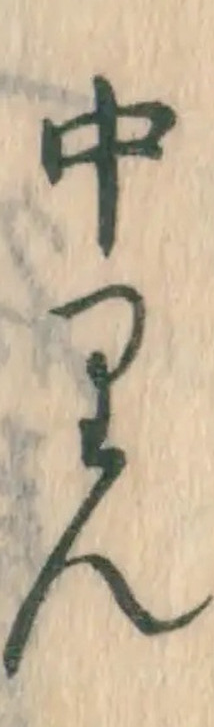中りん

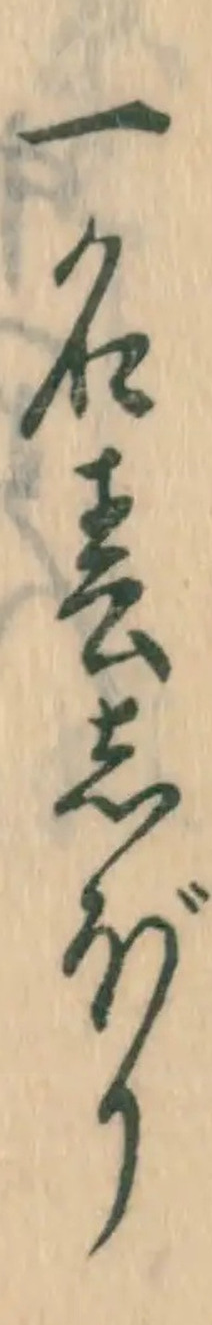一名春しぼり
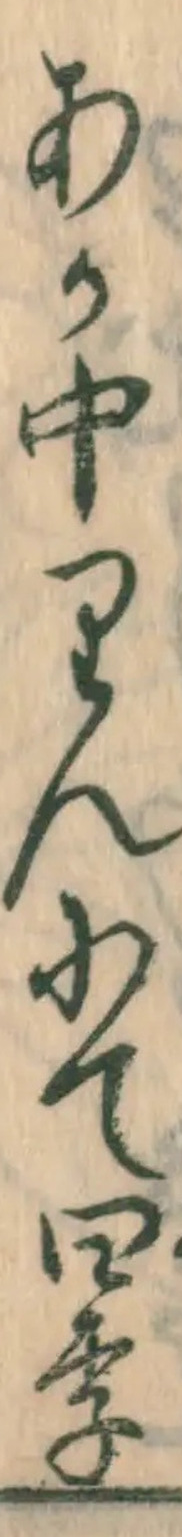あか中りんにて四季
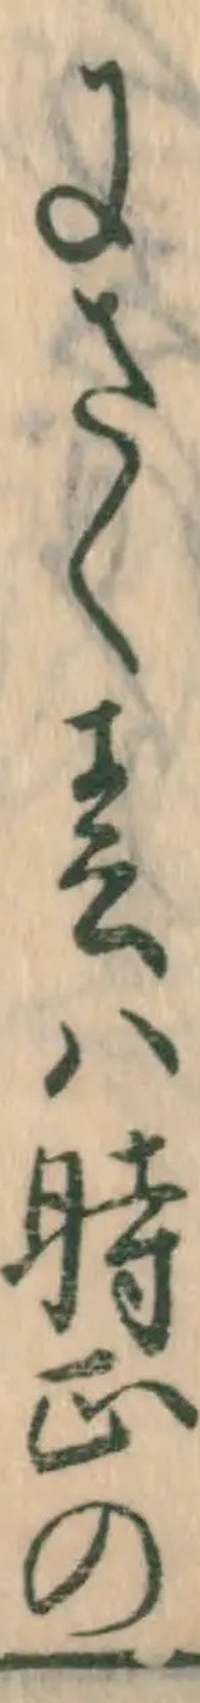にさく春は時正の
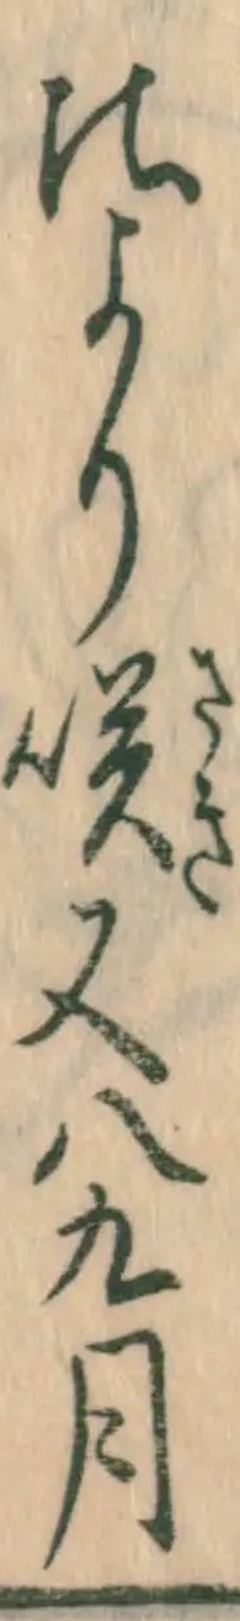頃より咲又八九月
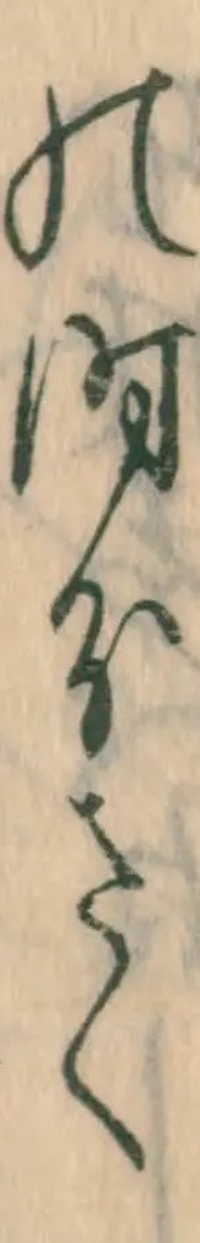の時分さく
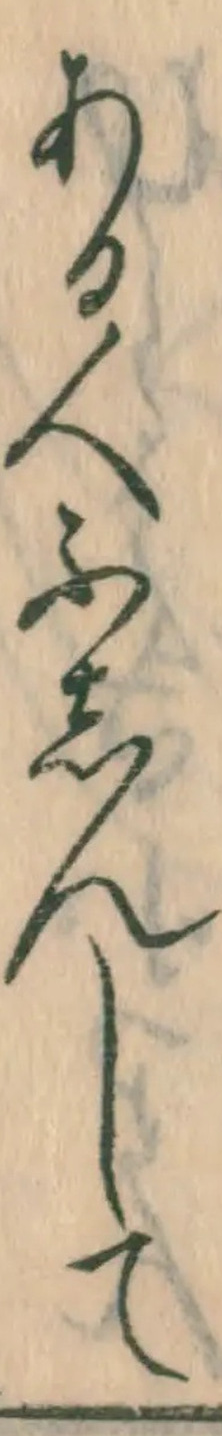ある人ふしんして
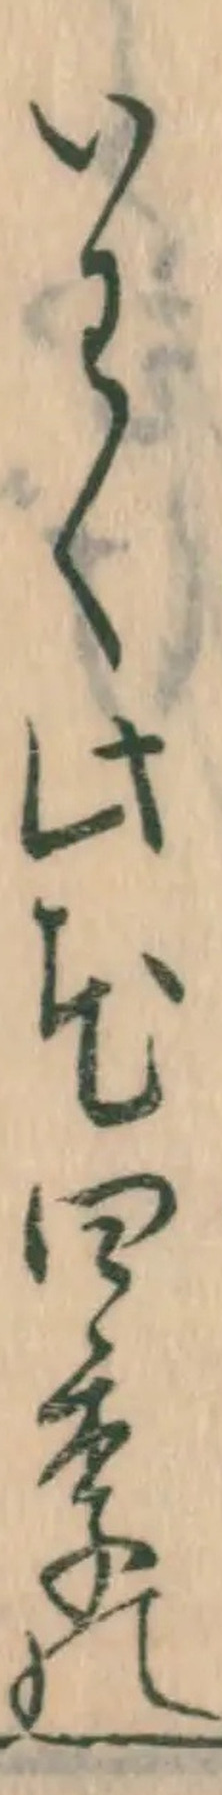いわく此花四季の
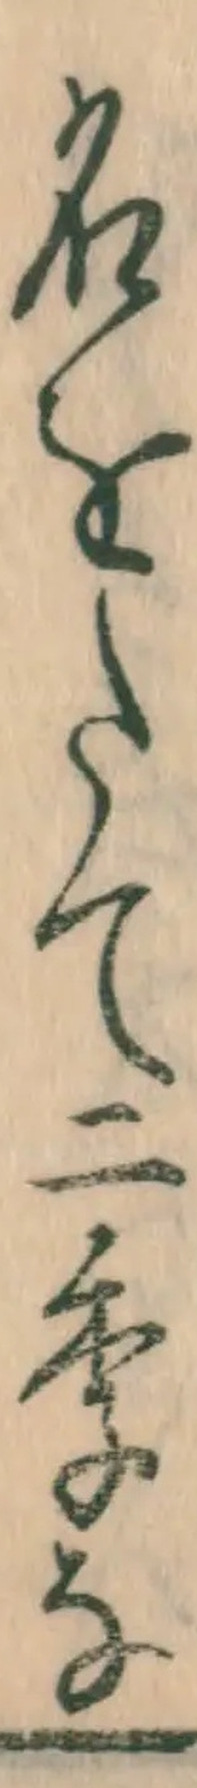名をたて二季な
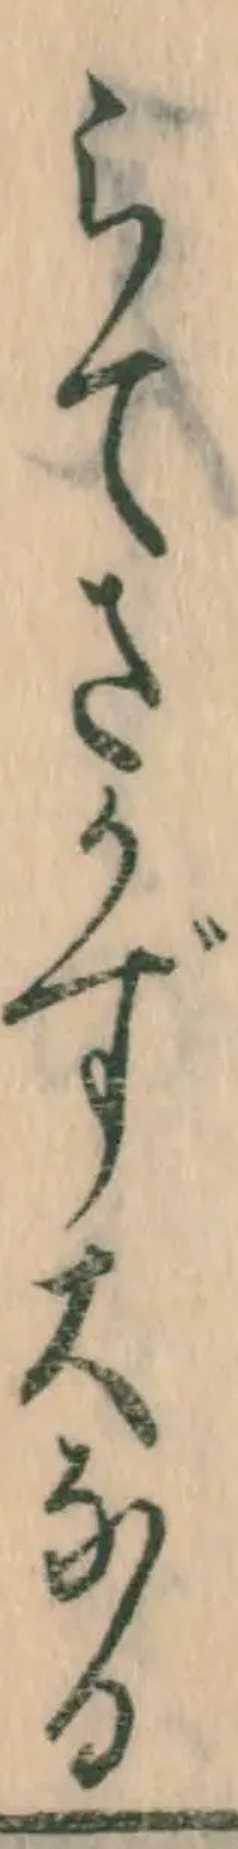らてさかず大なる
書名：錦繍枕 5巻. [2]
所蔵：国立国会図書館 National Diet Library, JAPAN
